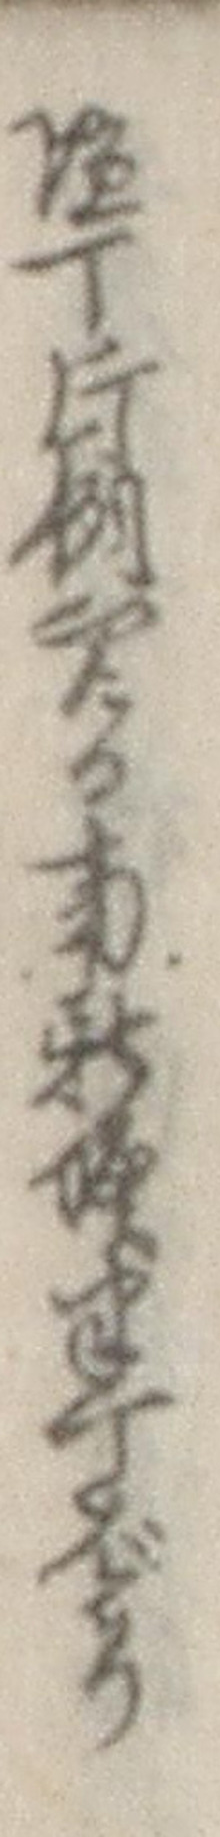種？丁片側やける南新堀半丁ばかり
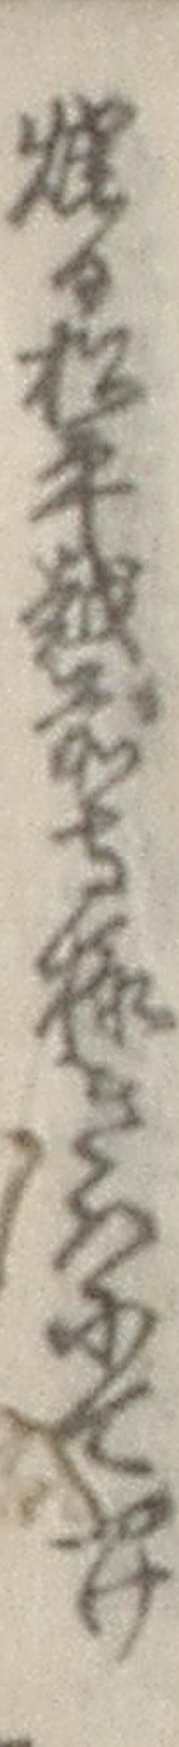焼る松平越前守様きはにてやけ
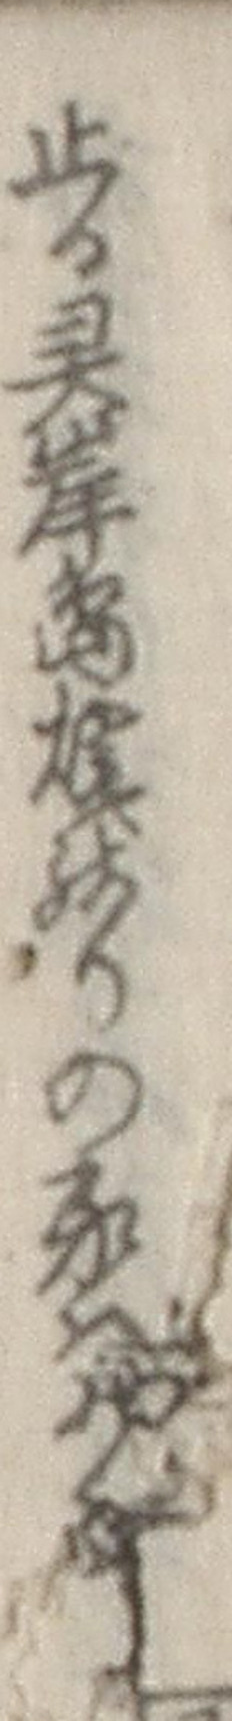止る霊岸島焼残りの家は霊岸島
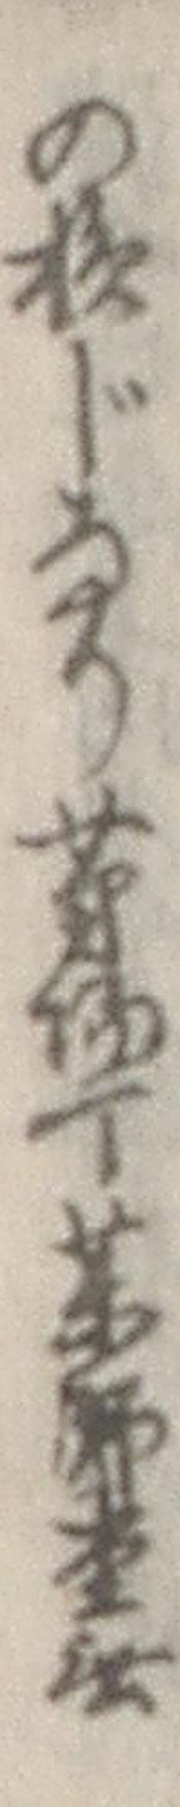の損じなり茅場丁薬師堂無
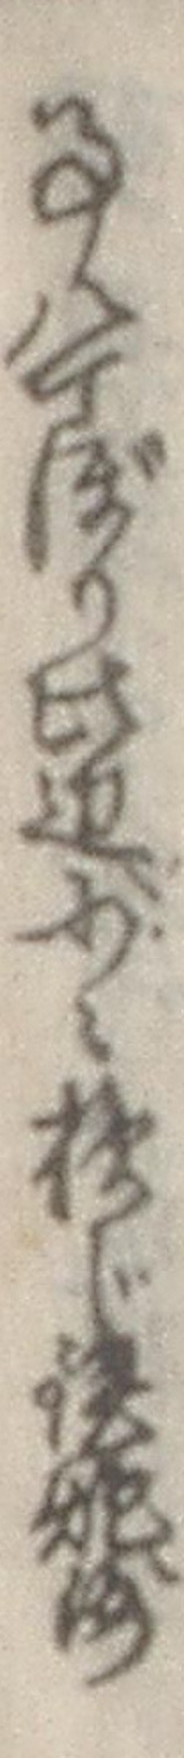事八丁ぼり此辺少〻損じ鉄炮洲
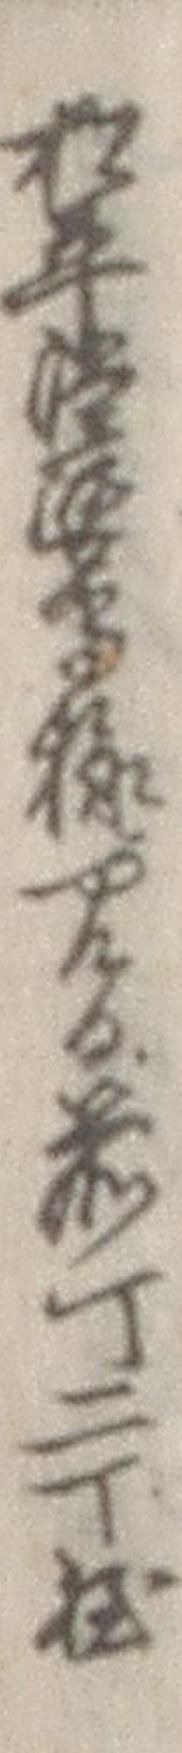松平淡路守様やける前丁二丁程
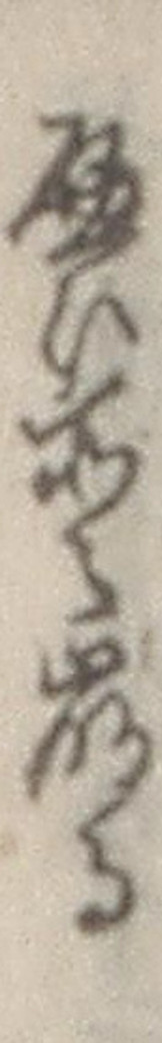へひ所〻崩る
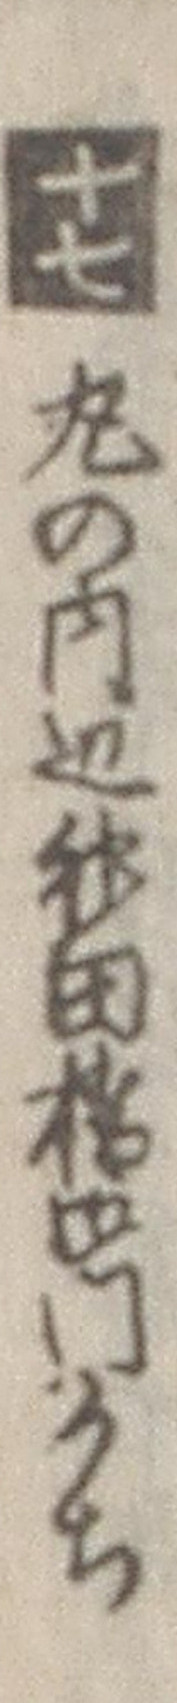十七丸の内辺神田橋御門うち
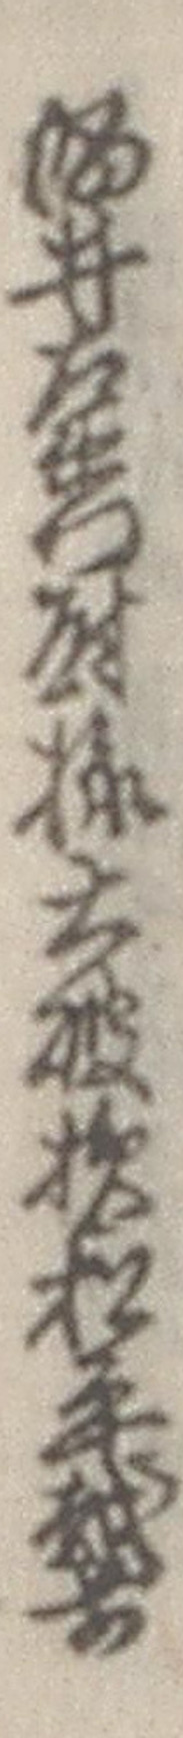酒井左衛門将様大破損松平越前
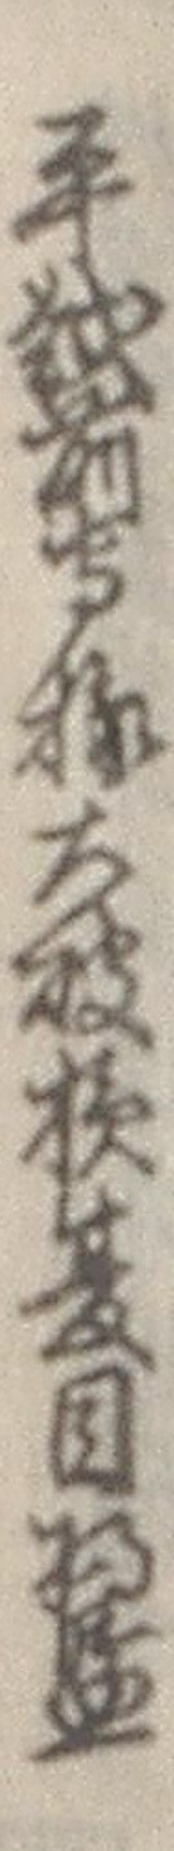平越前守様大破損夏目将監
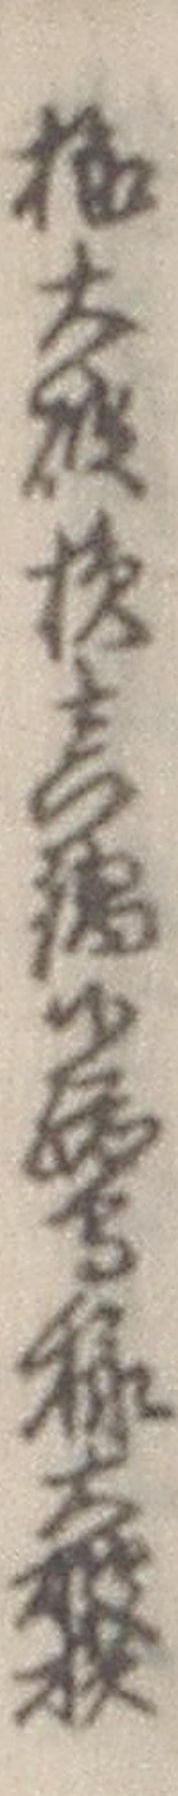様大破損真鍋下総守様大破損
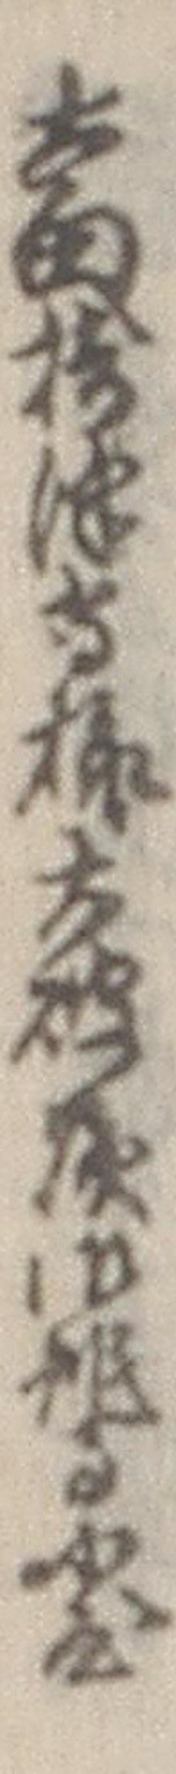古田摂津守様大破損御雉子小屋
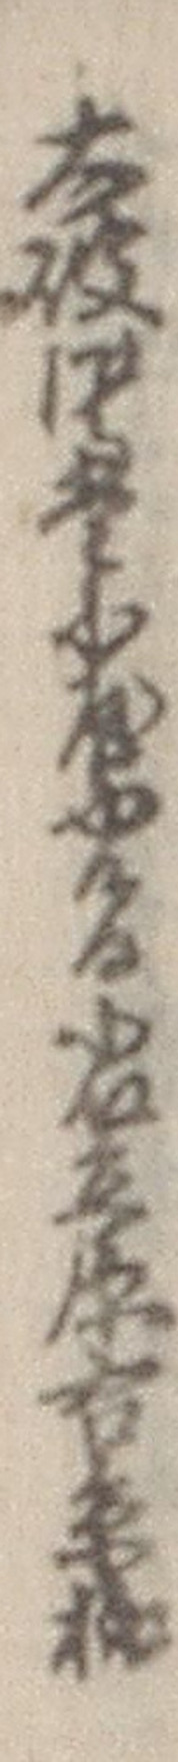大破御堂？小屋やける小笠原右京様
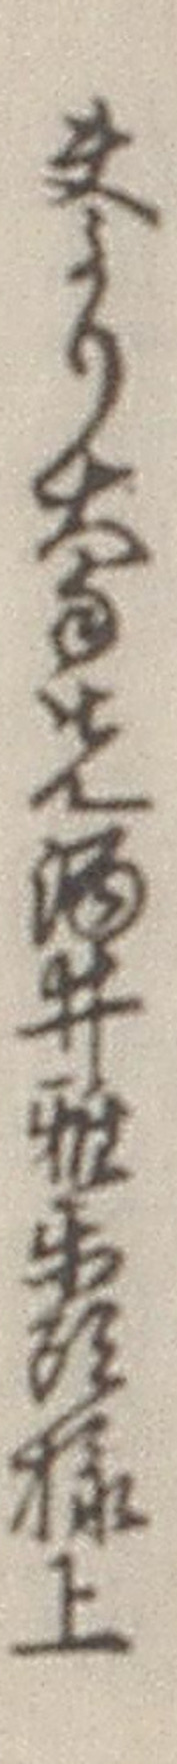夫より大手先酒井雅樂頭様上
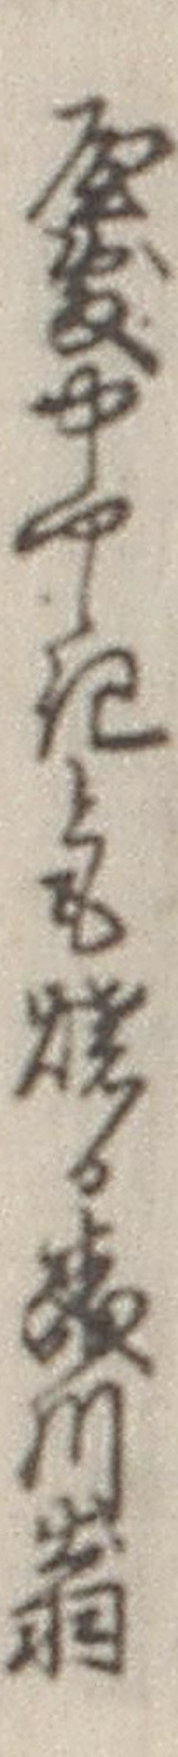家敷中やしきとも焼る森川出羽
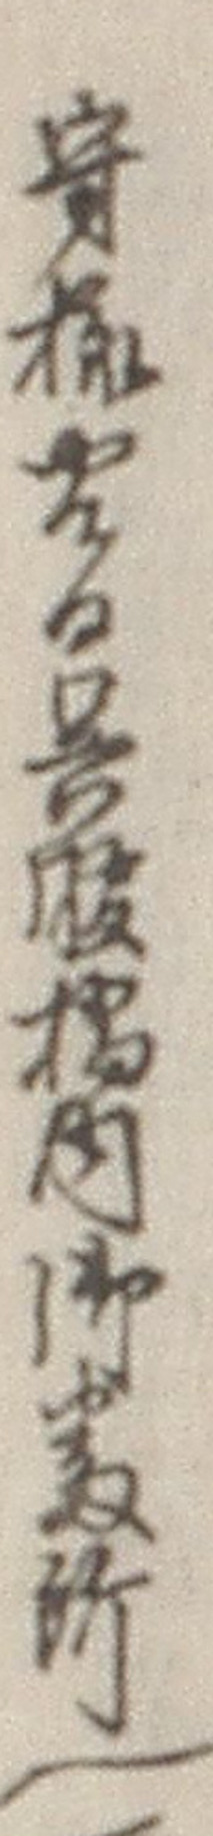守様やける呉服橋内御番所
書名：江戸　大地震臣細録　全
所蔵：東京大学地震研究所図書室 Earthquake Research Institute Library, The University of Tokyo, JAPAN
